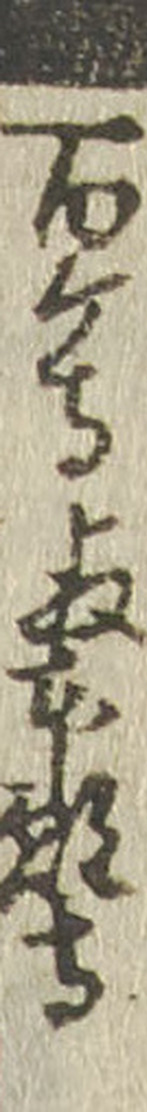百ヶ寺両本願寺
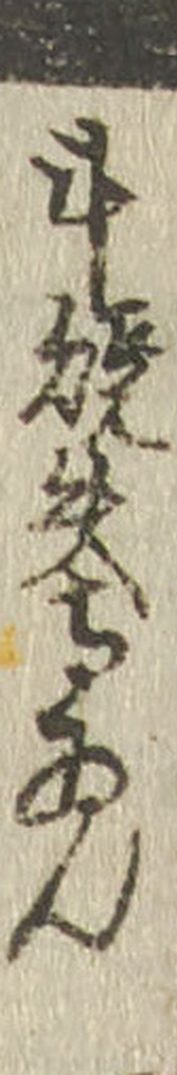斗焼失寺ゐん
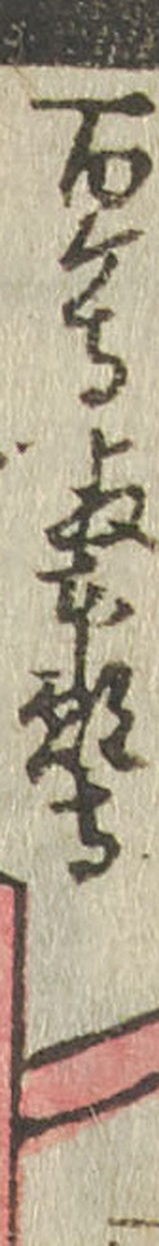百ヶ寺両本願寺
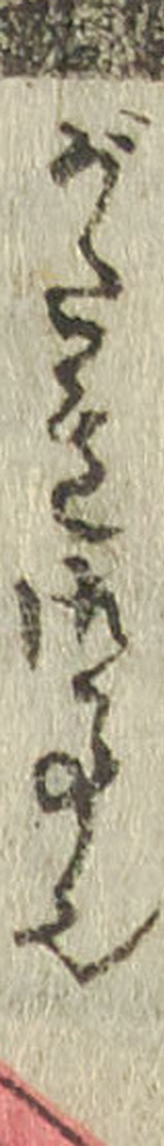かたき御事也
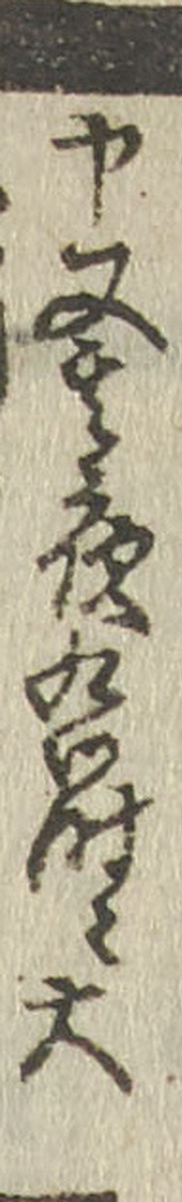申又其夜九ツ時ニ大
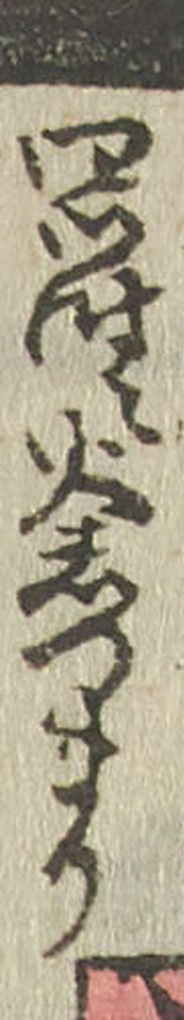四ツ時ニ火しつまり
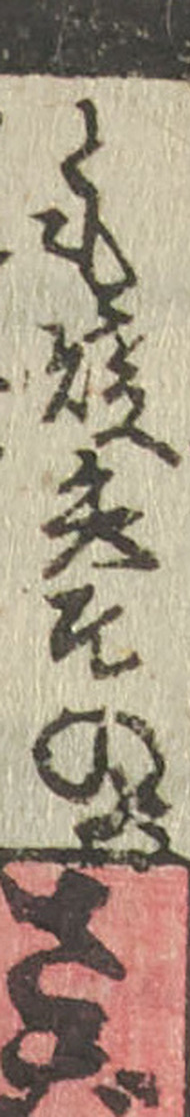とも焼失その後
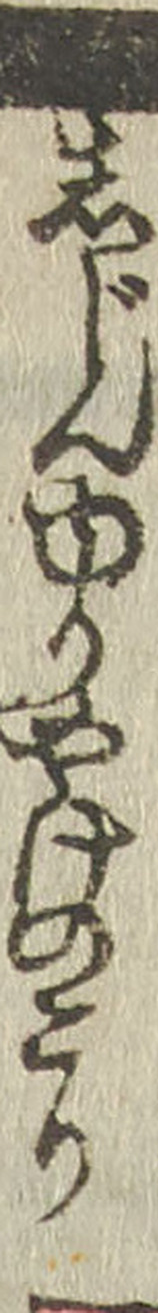しじんゆりやけのこり
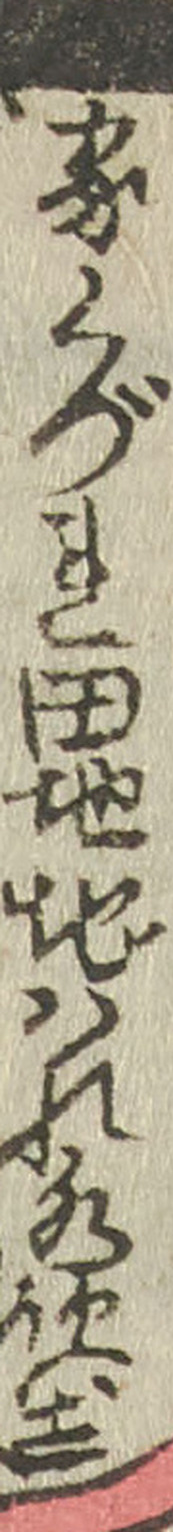家くづれ田地地ハれ水吹出し
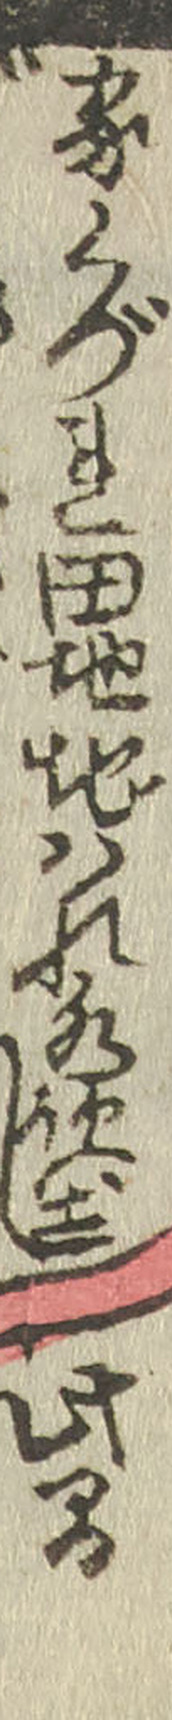家くづれ田地地ハれ水吹出し
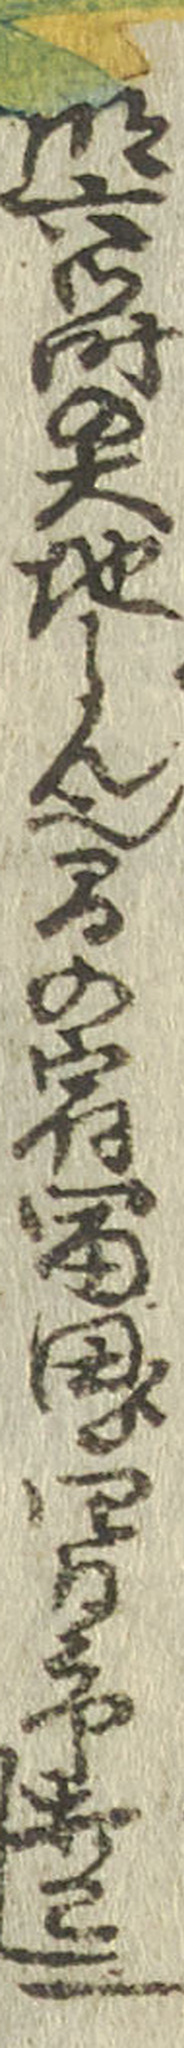明六ツ時の大地しん也間の宿富田ゟ四日市打こし
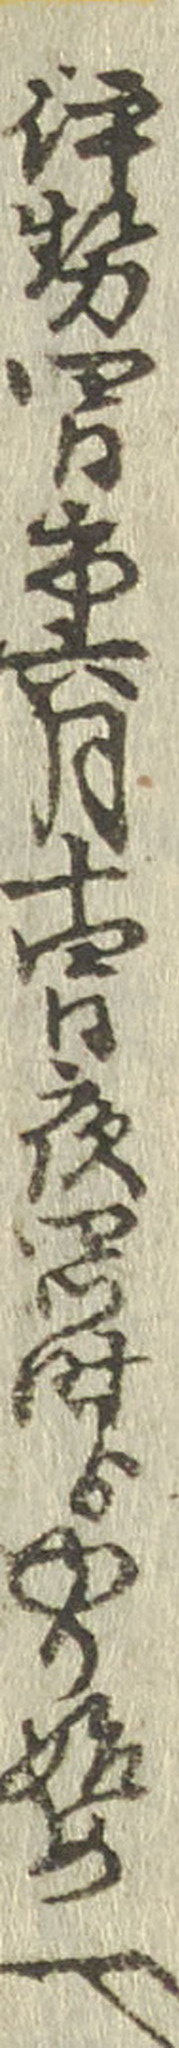伊勢四日市六月十四日夜四ツ時ゟゆり始め
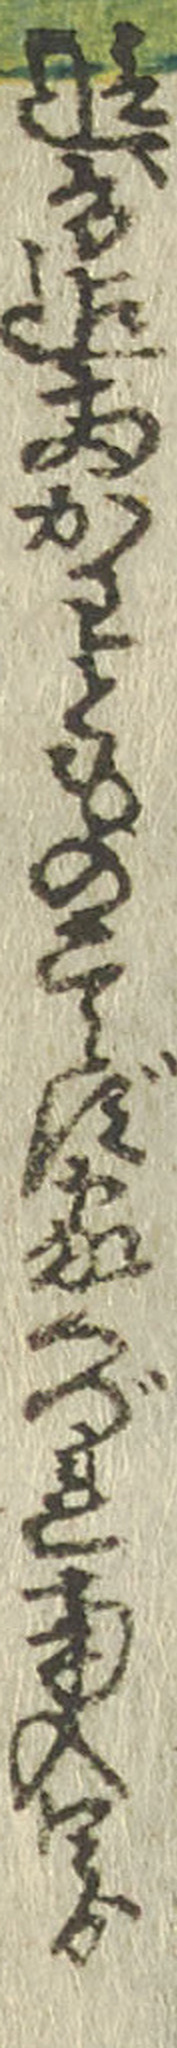追分迄両かわとものこらず家くづれ南入口ゟ
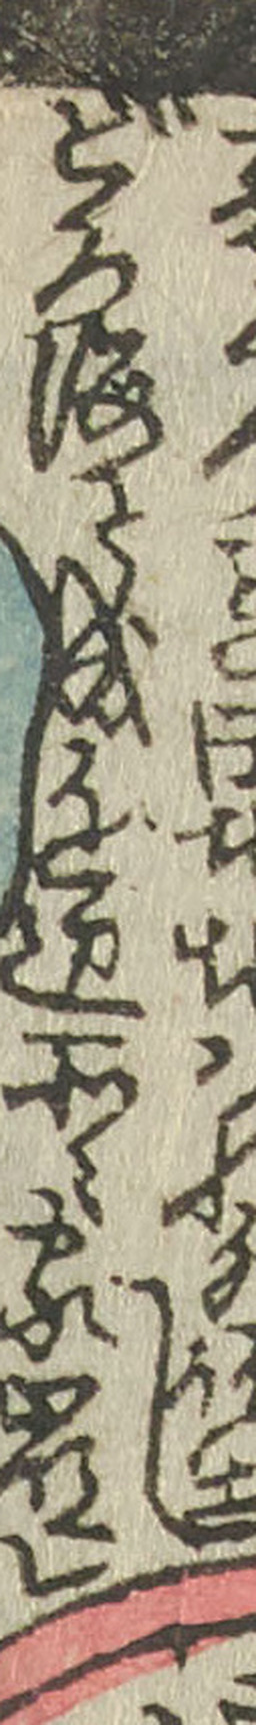どろ海と成近辺所〻家崩レ
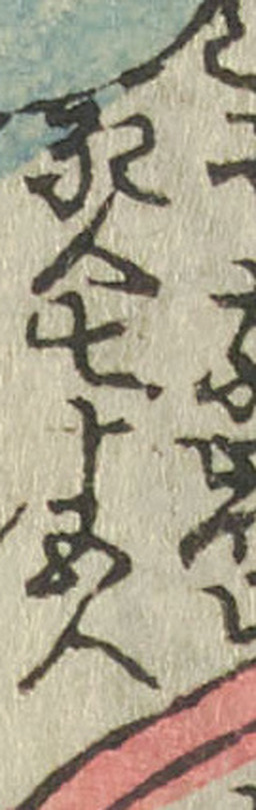死人七十五人
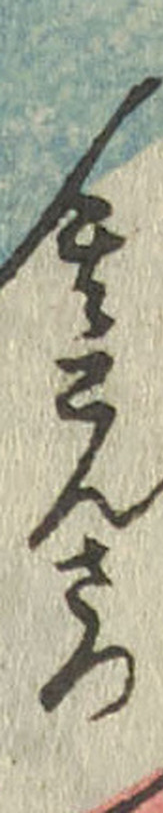其こんさつ
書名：大地震早引方角附
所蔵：東京大学総合図書館 General Library in the University of Tokyo, JAPAN
